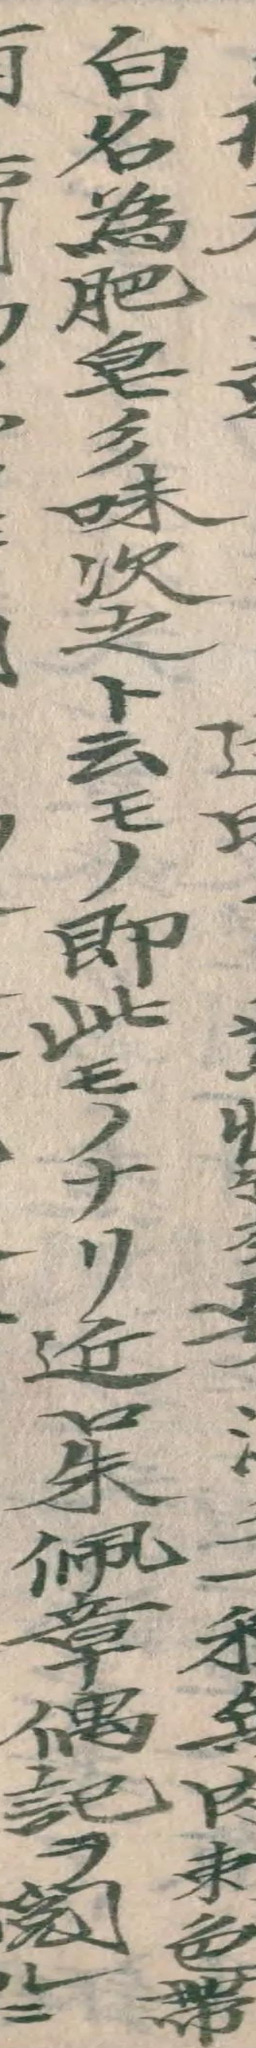白名為肥皂彡味次之ト云モノ即此モノナリ近口朱佩章偶記ヲ閲ルニ
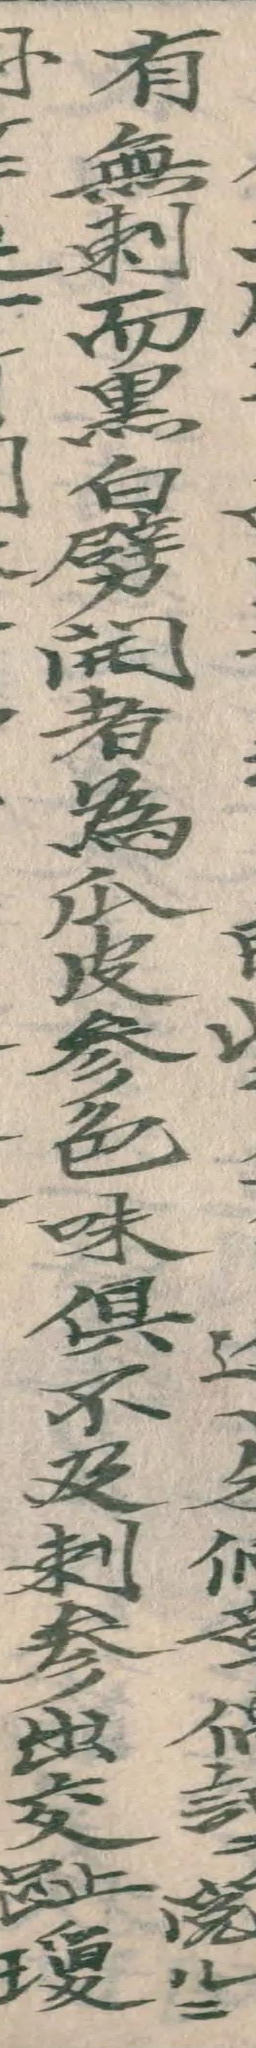有無刺而黒白劈開者為瓜皮参色味倶不及刺参出交趾瓊
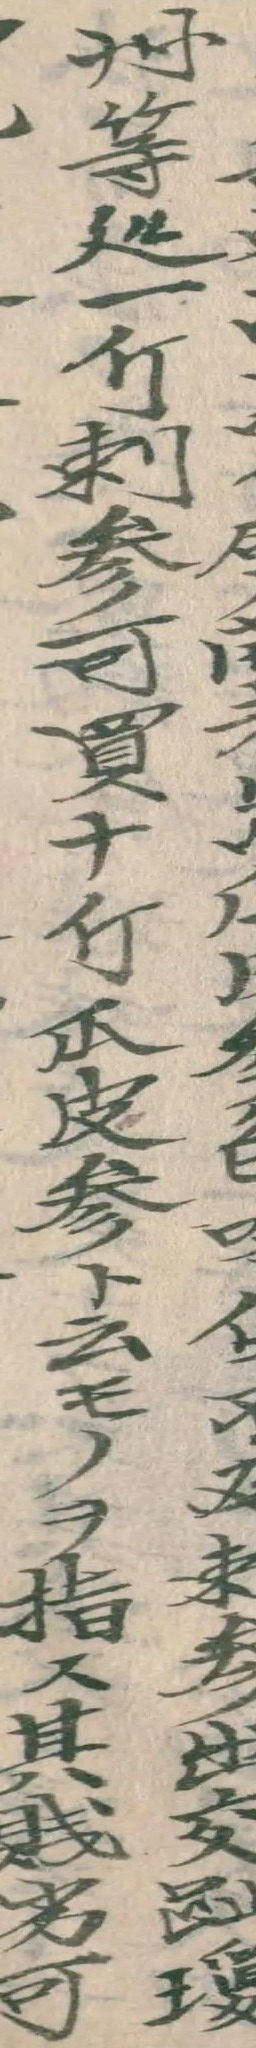州等処一斤刺参可買十斤瓜皮参ト云モノヲ指ス其賤劣可
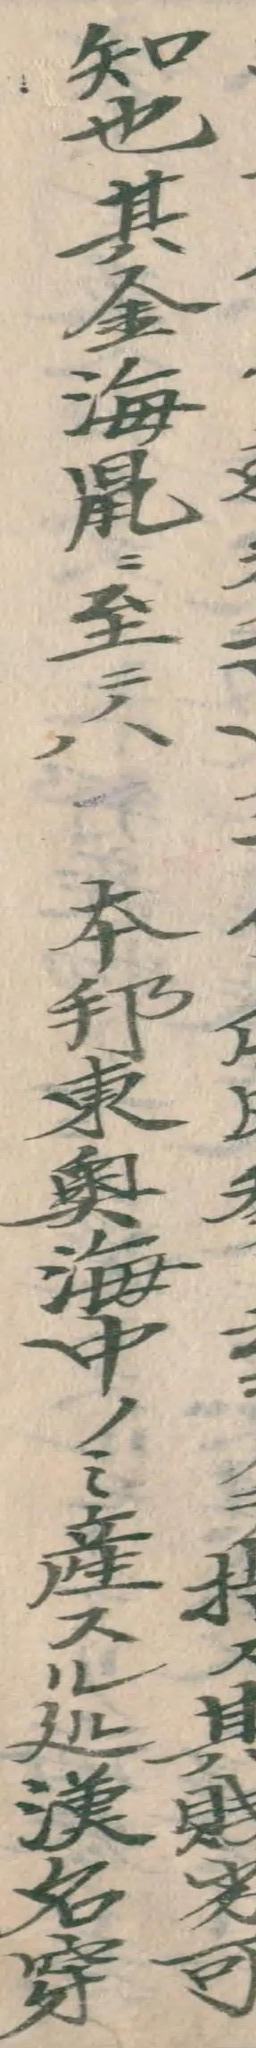知也其金海鼠ニ至テハ本邦東奥海中ノミ産スル処漢名穿

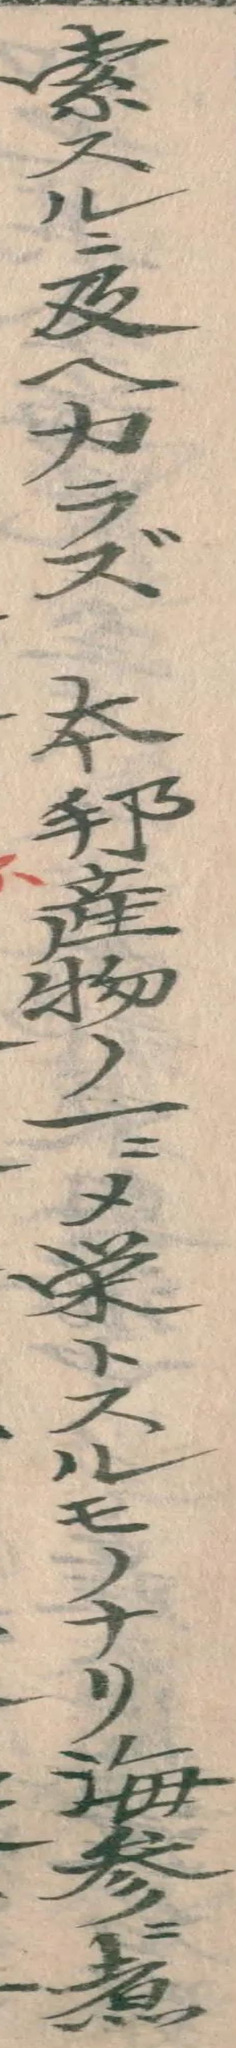索スルニ及ヘカラズ本邦産物ノ一ニシテ栄トスルモノナリ海参ニ煮
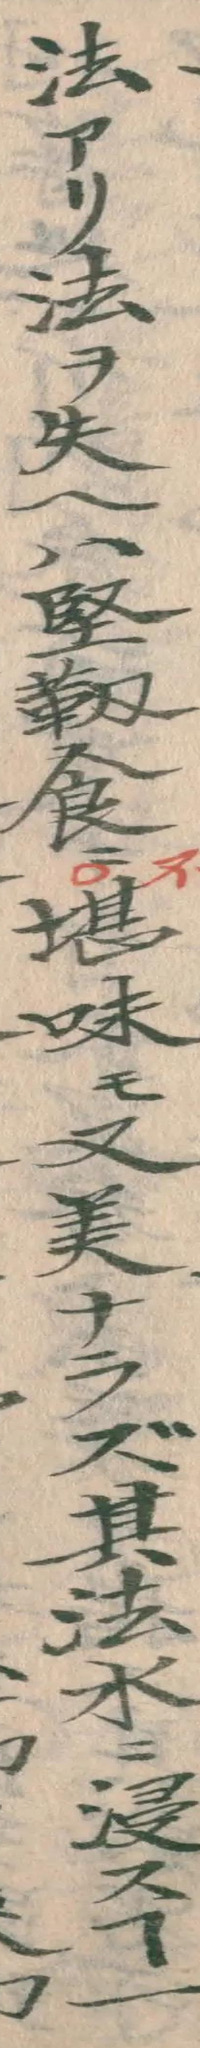法アリ法ヲ失へハ堅靭食ニ◦堪味モ又美ナラズ其法水ニ浸スコト一
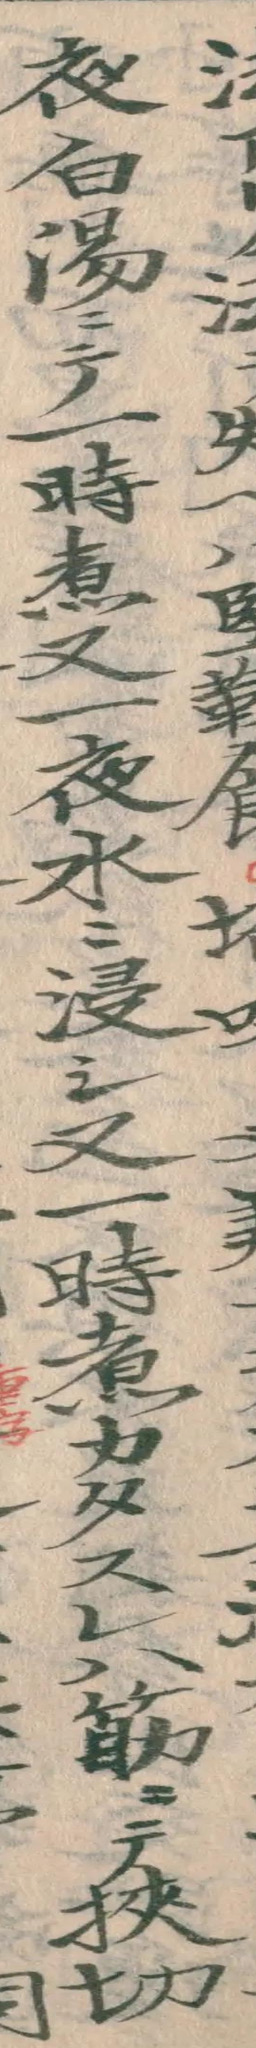夜白湯ニテ一時煮又一夜水ニ浸シ又一時煮カタスレハ筯ニテ挟切
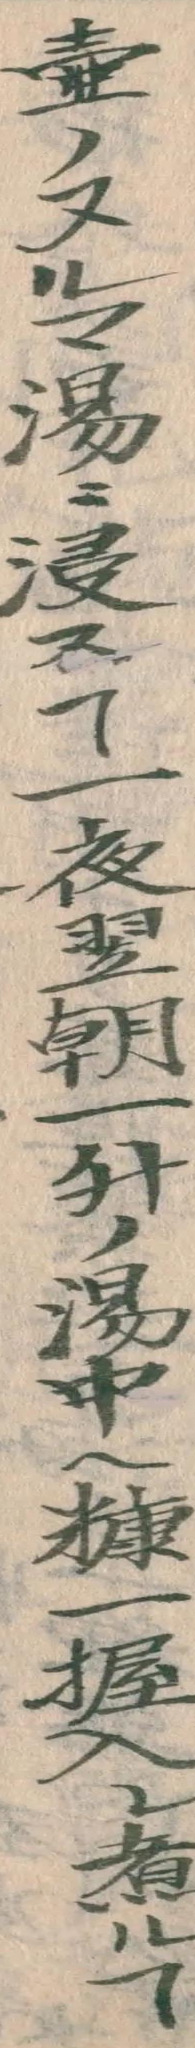壺ノヌルマ湯ニ浸すコト一夜翌朝一升ノ湯中ヘ糠一握入レ煮ルコト
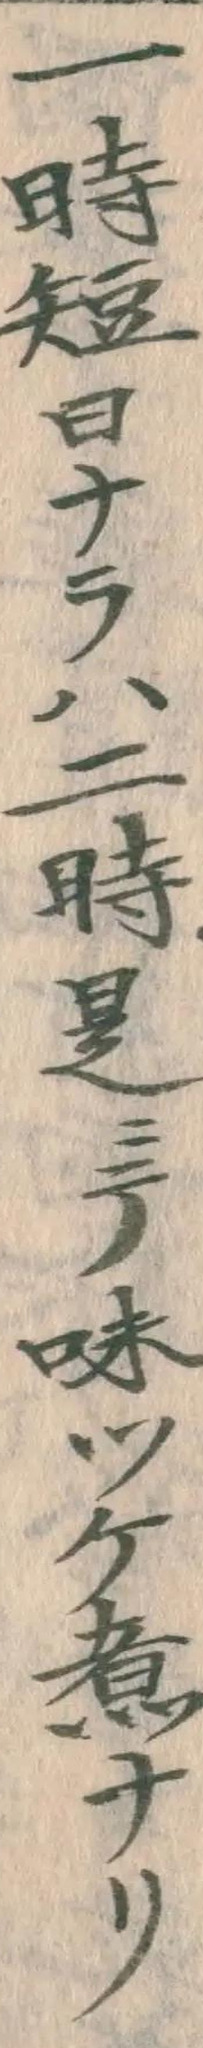一時短日ナラハ二時是ニテ味ツケ煮ナリ

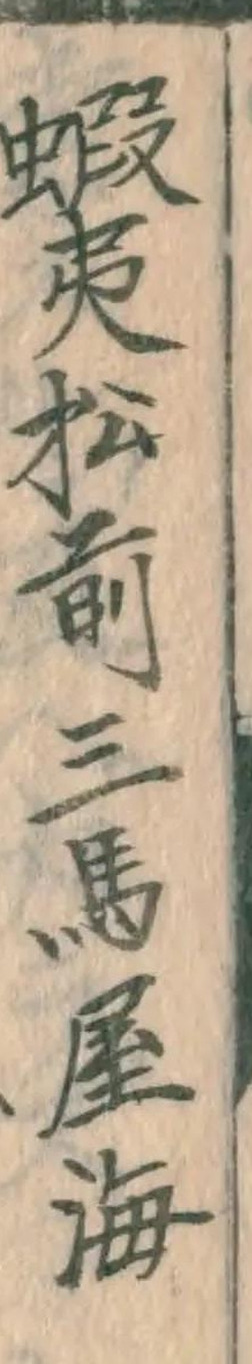蝦夷松前三馬屋海
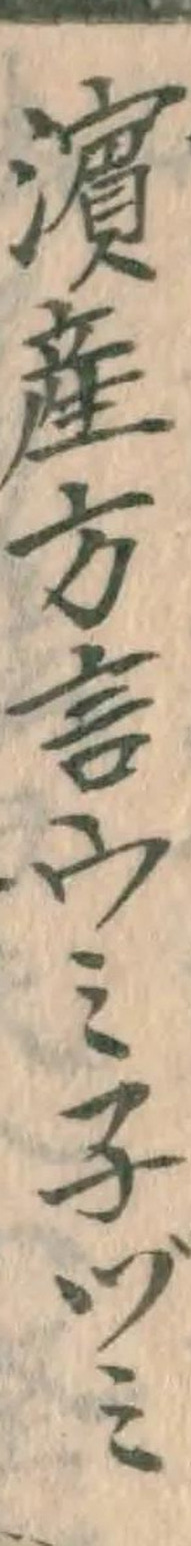浜産方言ウミネヅミ
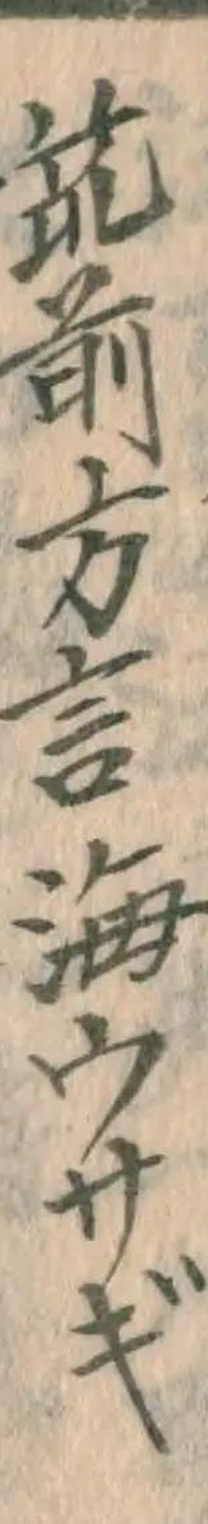筑前方言海ウサギ
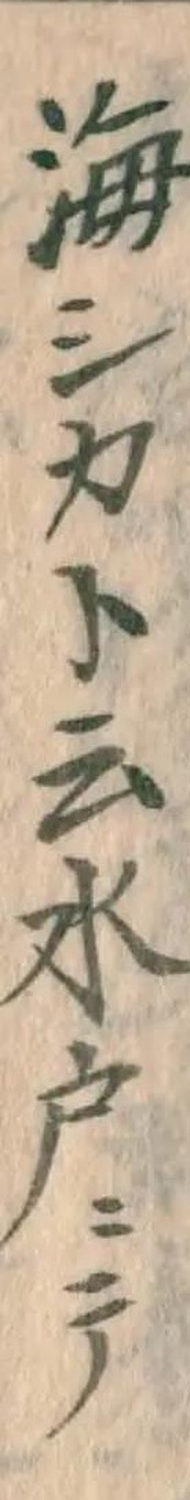海シカト云水戸ニテ
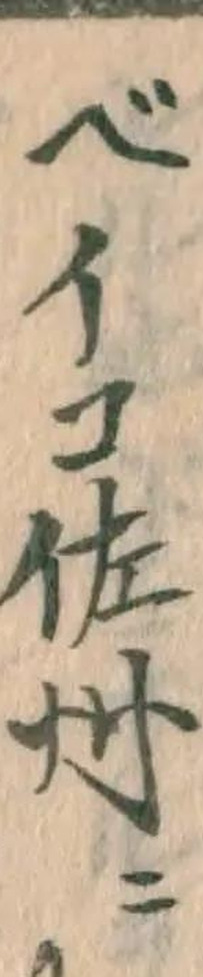ベイコ佐州ニ
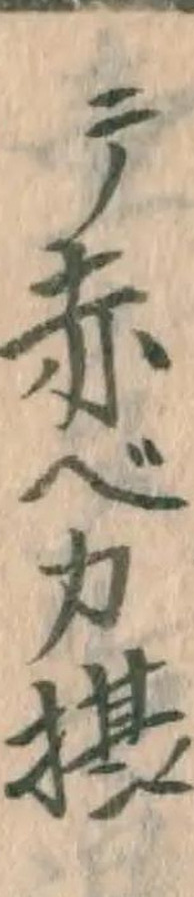テ赤ベカ摂
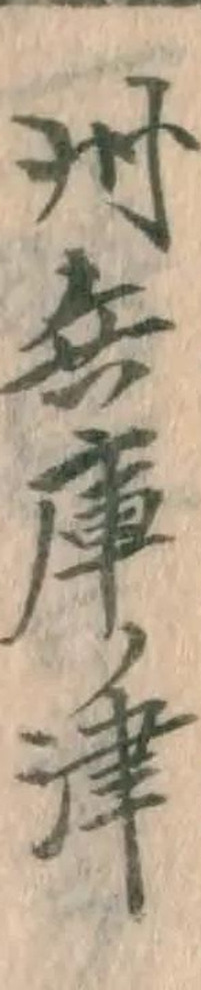州兵庫ノ津
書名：千蟲譜 3巻. [3]
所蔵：国立国会図書館 National Diet Library, JAPAN
